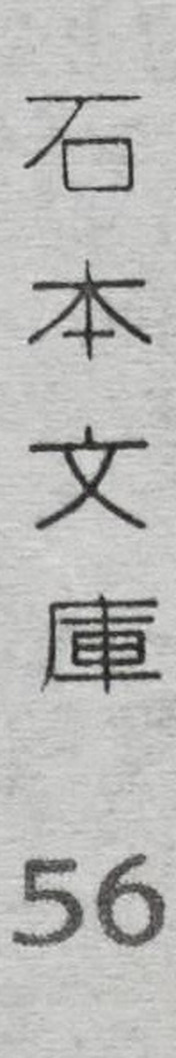石本文庫
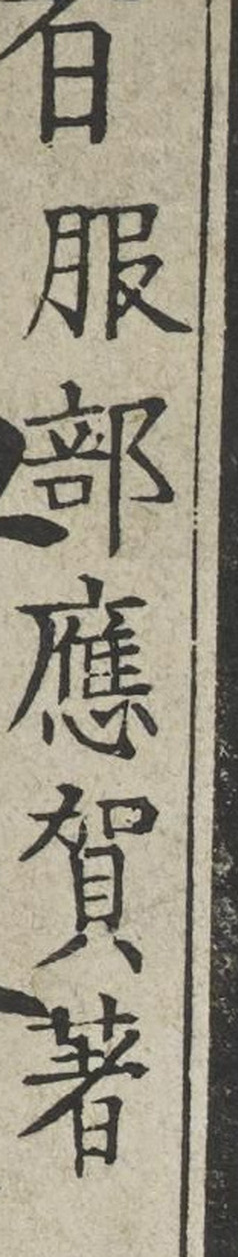服部應賀著
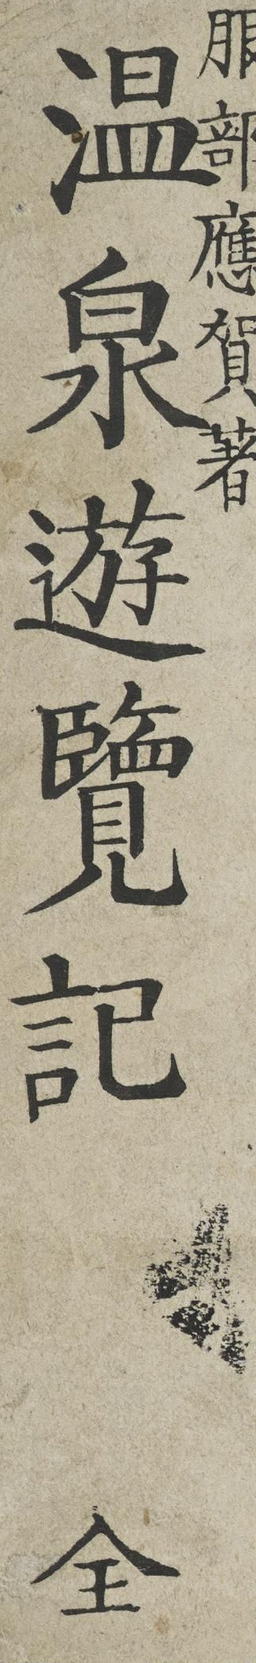温泉遊覧記全」

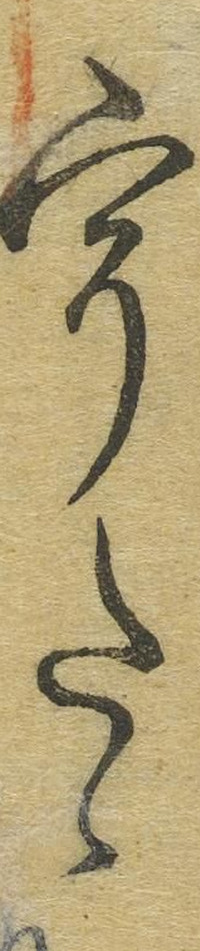うたゝ
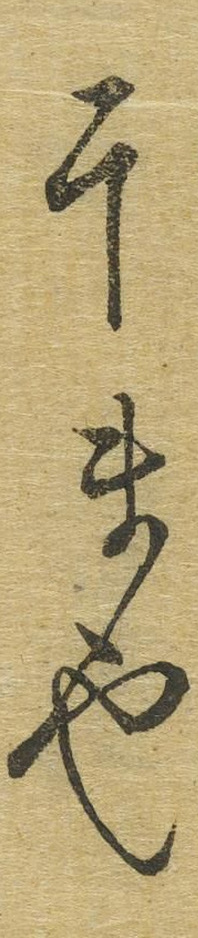干まや
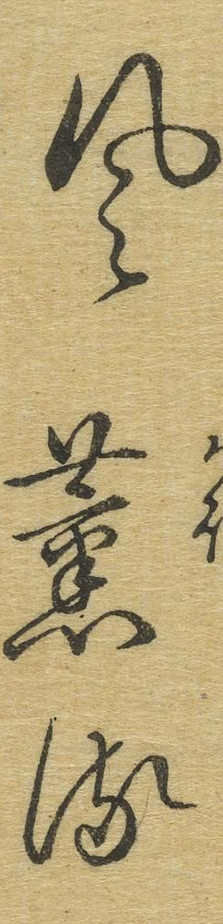風薫る
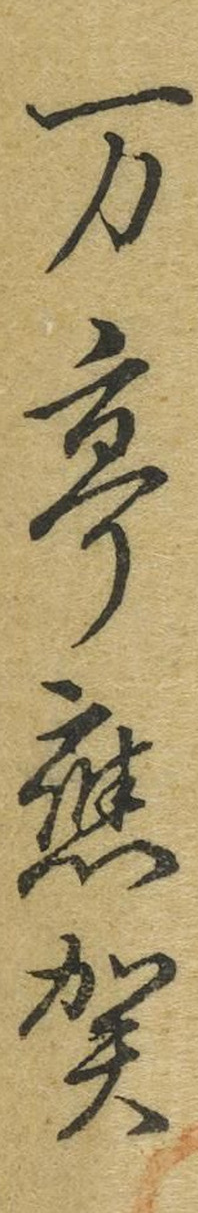万亭應賀
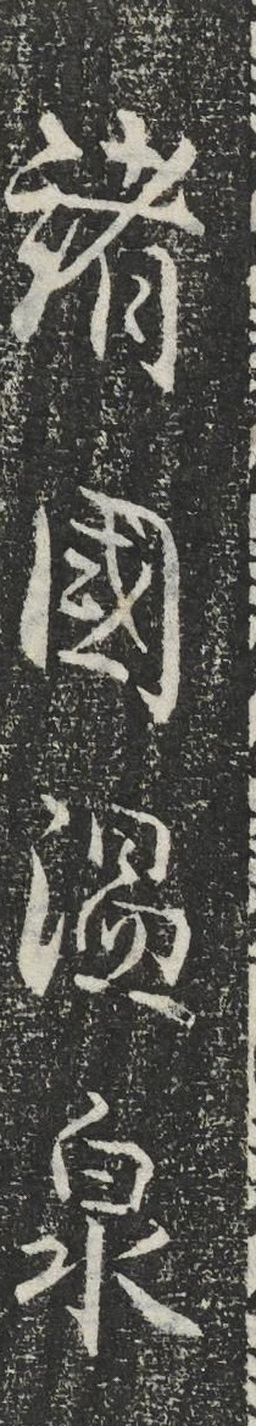諸国温泉
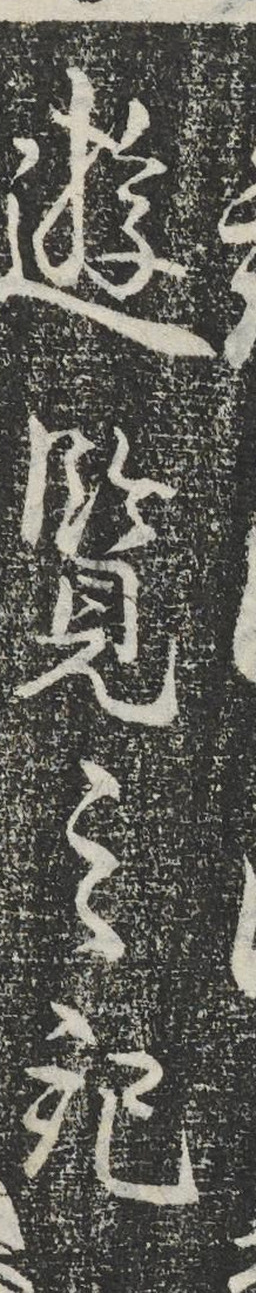遊覧之記
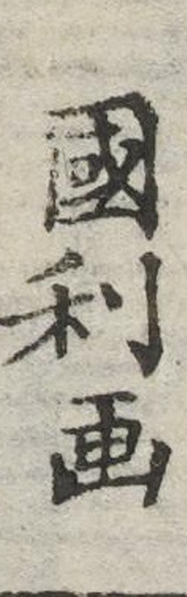國利画

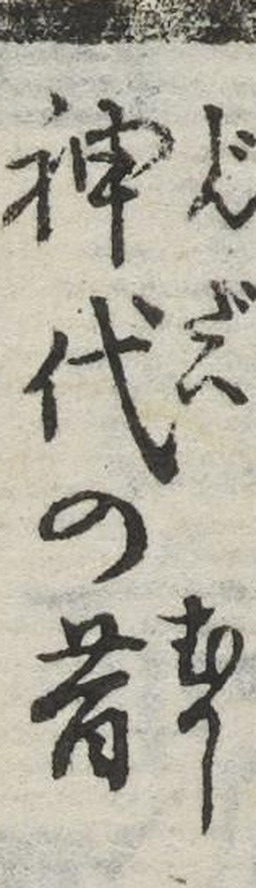神代の昔
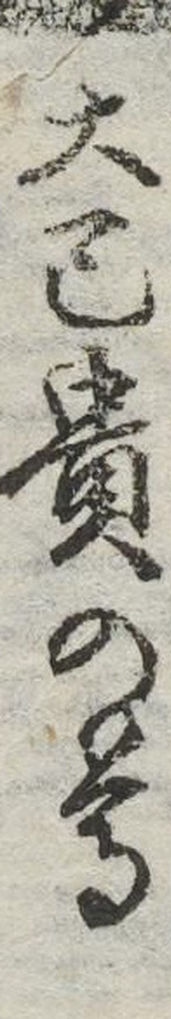大己貴の尊
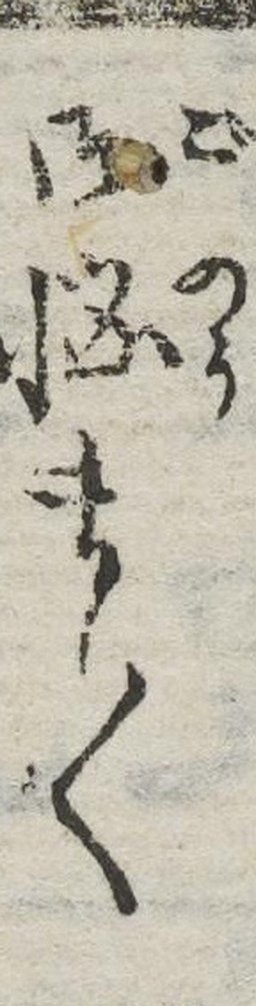御悩まし〳〵
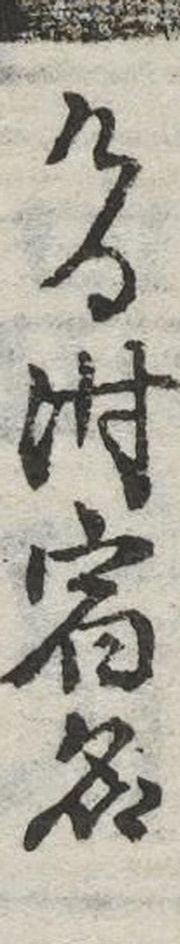ける時宿名
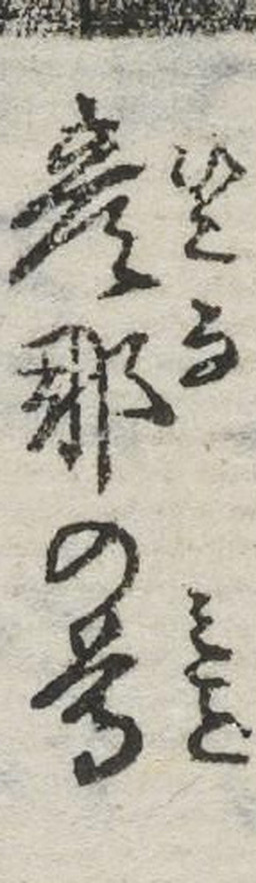彦那の尊
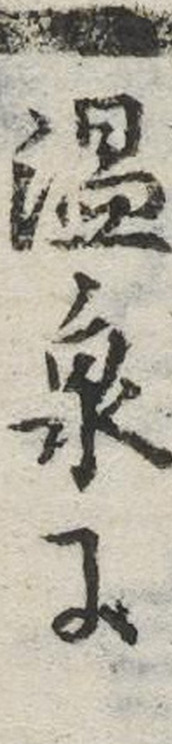温泉に
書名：諸國温泉遊覽記　全
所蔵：東京大学地震研究所図書室 Earthquake Research Institute Library, The University of Tokyo, JAPAN
